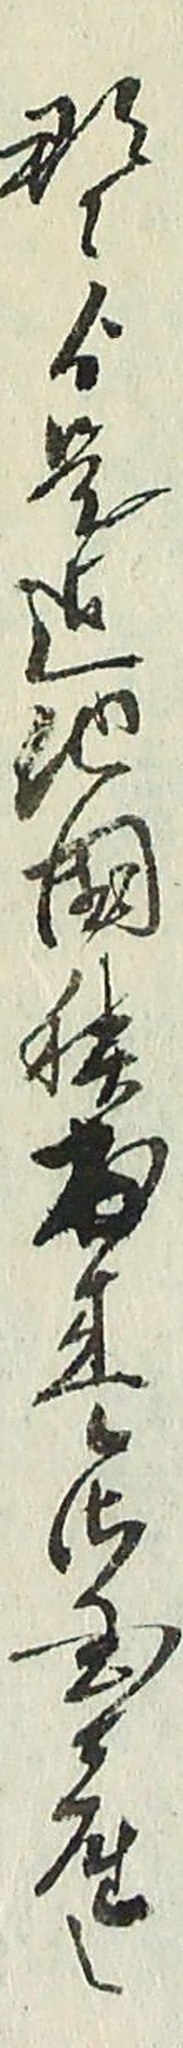七十六郡々ゟ是迄他国積出来候御国産之
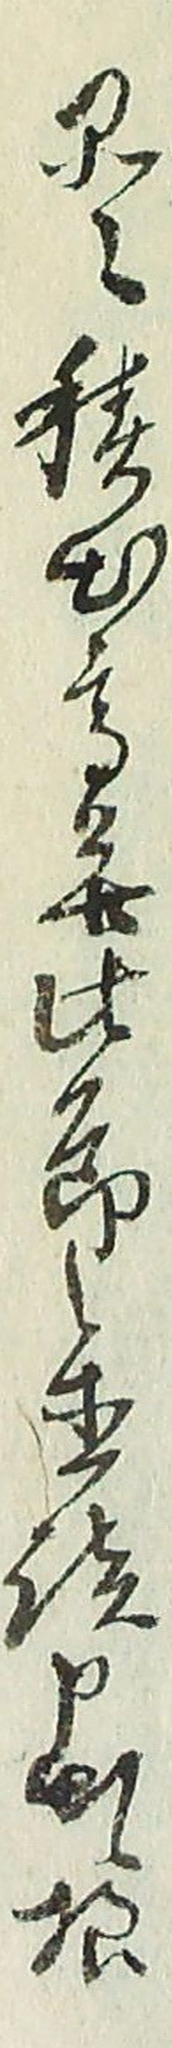品々積出高幷此節之直談申出候様
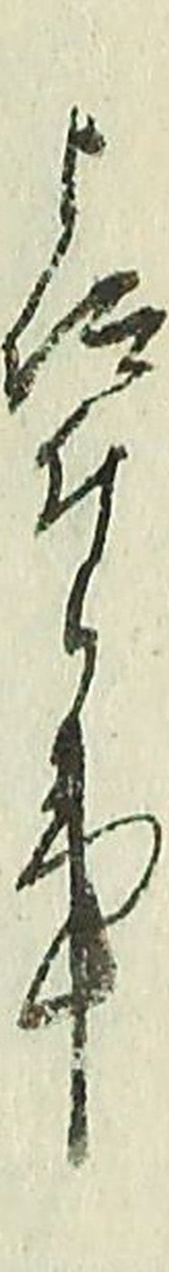被仰付候事
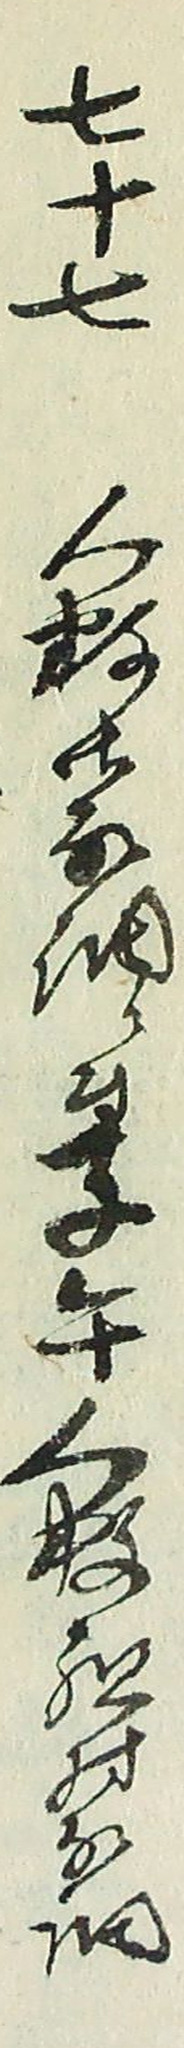七十七人数御取調ニ付子午人数組村取調
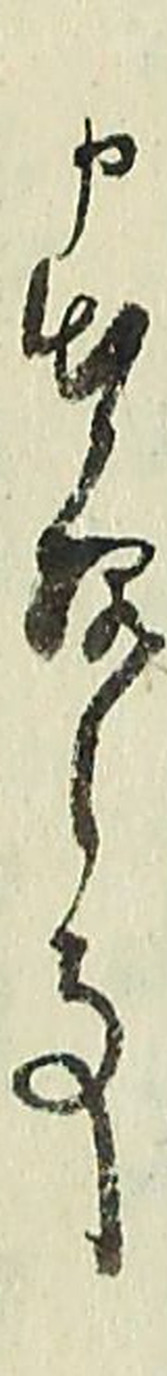申出候様之事
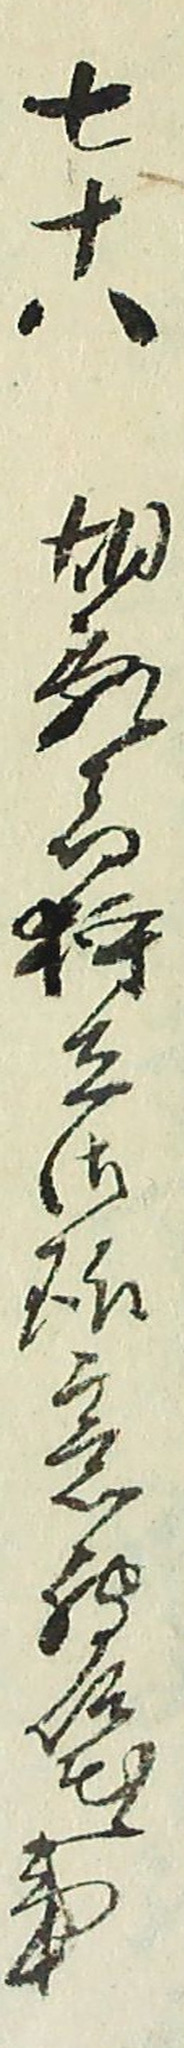七十八胡乱者狩立御趣意被仰出候事

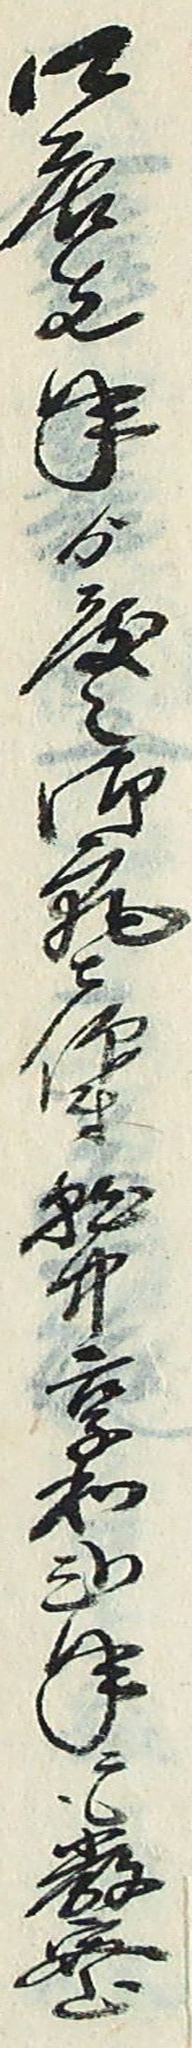郷店先年ゟ度々御究被仰付就中享和弐年ニも厳密
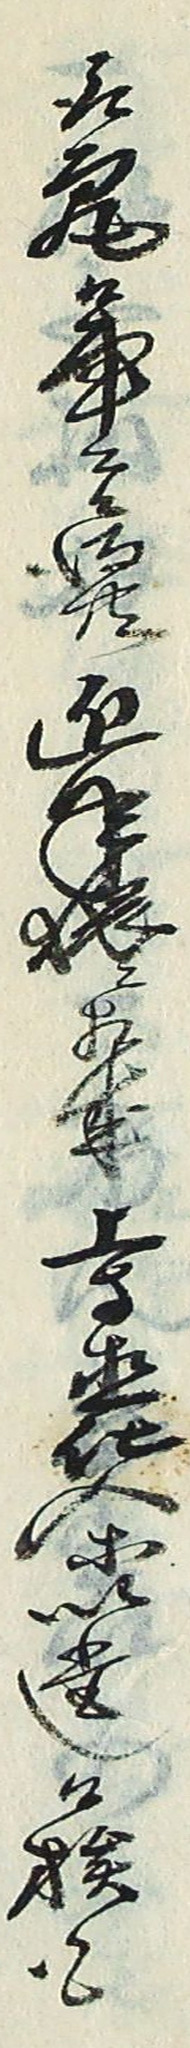取究候事ニ候得共近年猥ニ相成上方直仕入等いたし候族も
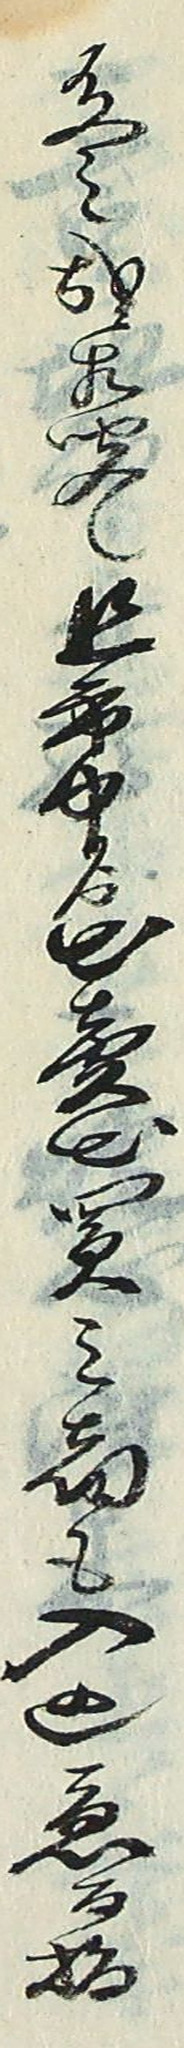有之候哉ニ相究候旦市中ゟ出賣出買之者も入込兼而指
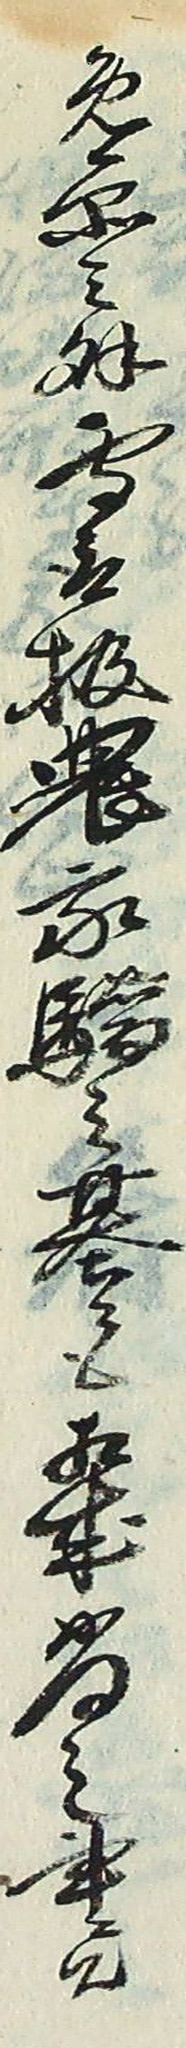免候品之外専取扱農家驕之基ニも相成如何之事ニ候
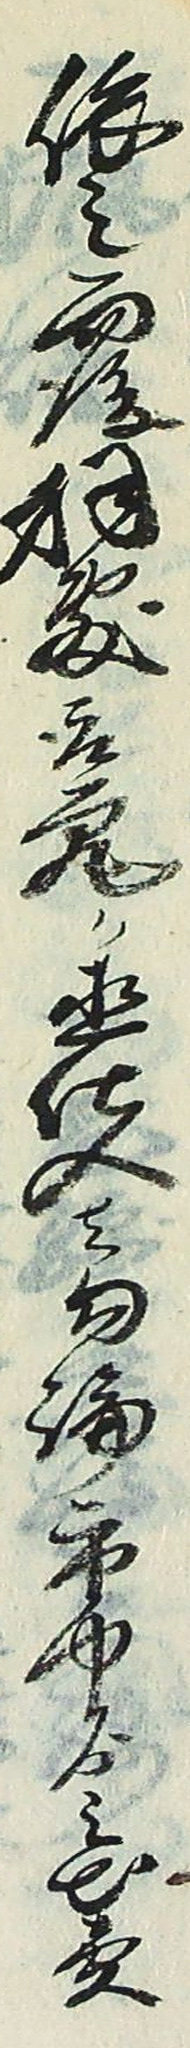依之向後稠敷取究り直仕入者勿論市中ゟ之出賣
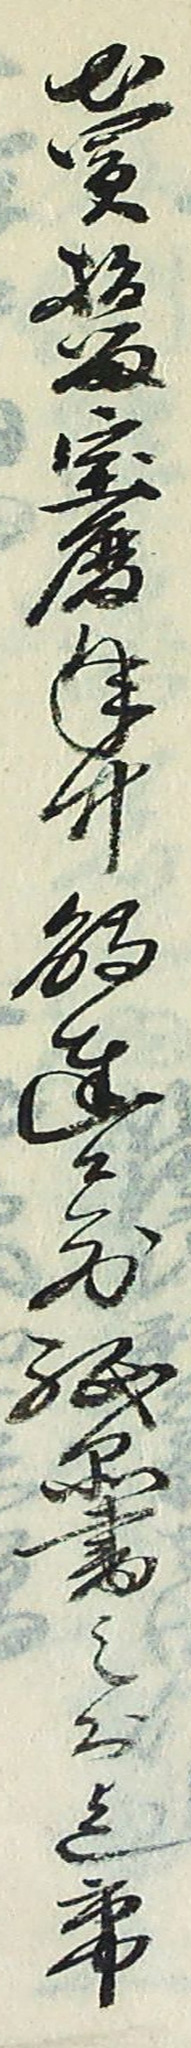出買指留宝暦年中觸達候別紙品書之分迄市中
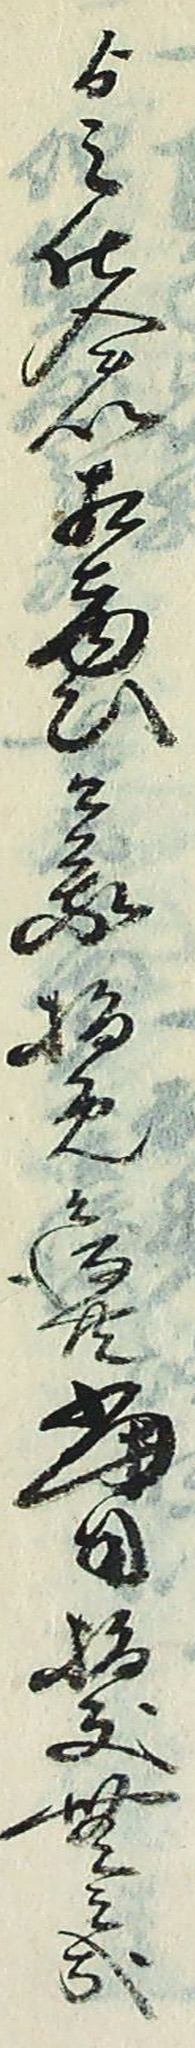ゟ之仕入ヲ以相商ひ候義指免候得共當用指支無之哉
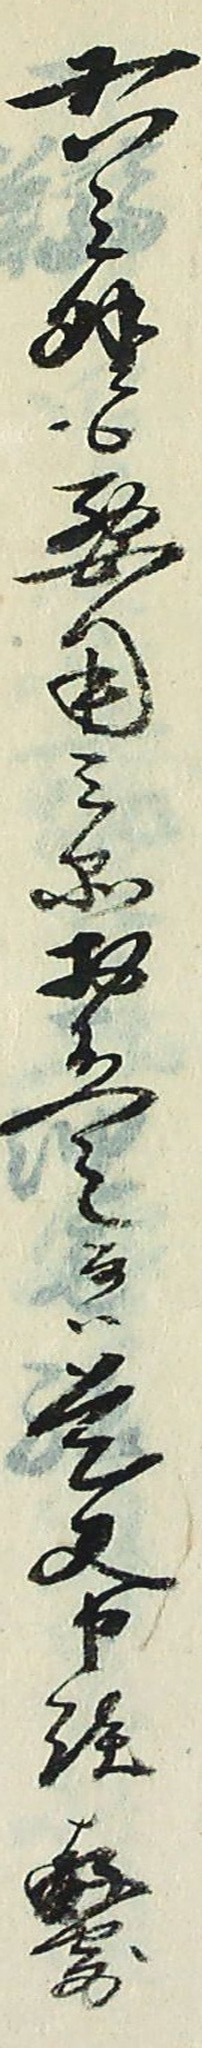右之外ニも要用之品於有之而ハ是又申談存寄
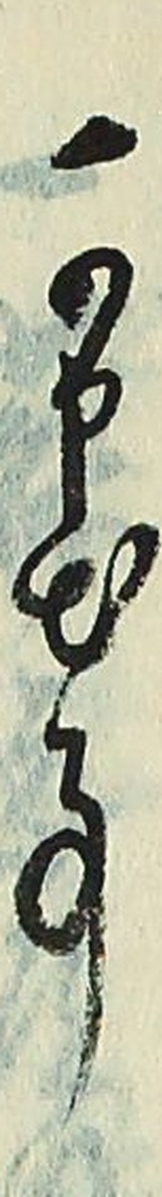可申出事
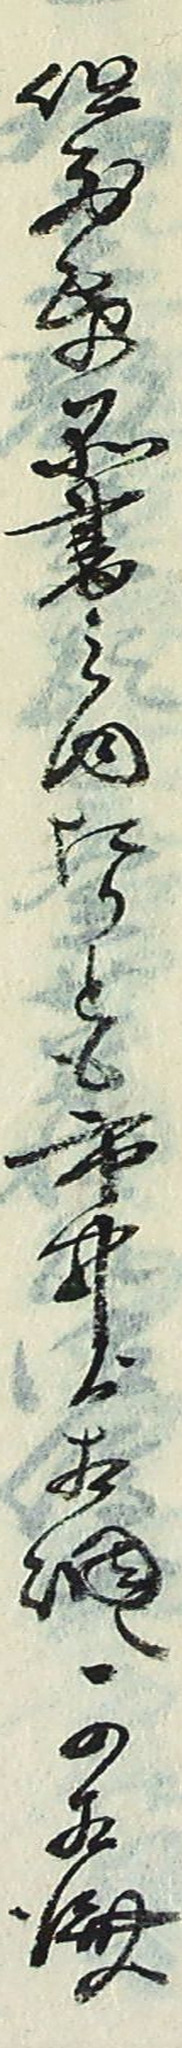但別帋品書之内たりとも市中ゟ相調へ可相濟
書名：諸御趣意書并御下知向之写
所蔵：鳴門教育大学 Naruto University of Education
